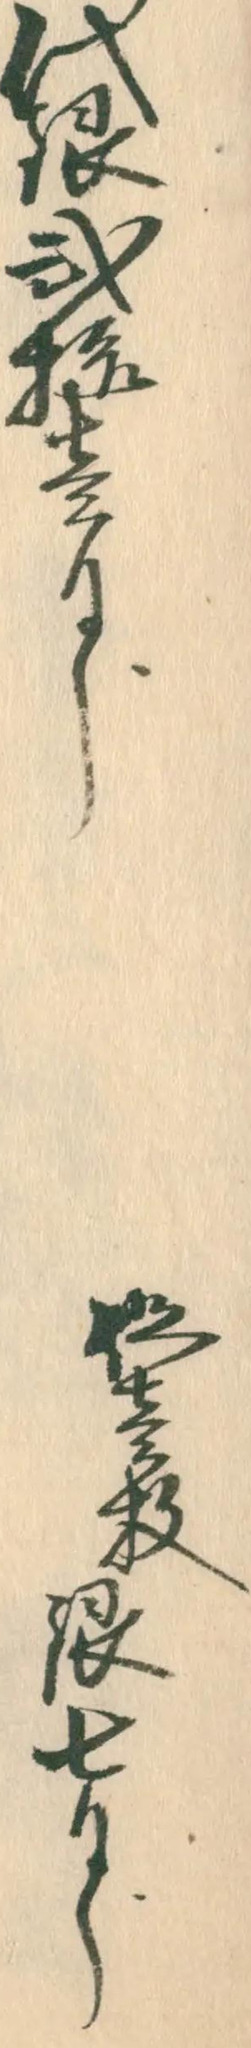代銀弐拾壱匁但壱枚銀七匁
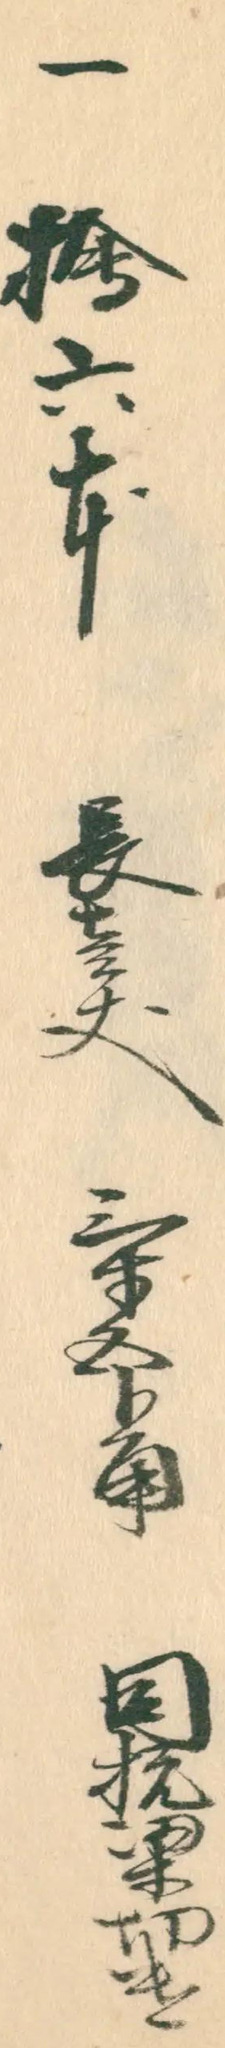一桧六本長壱丈三寸五分角同杭梁切遣
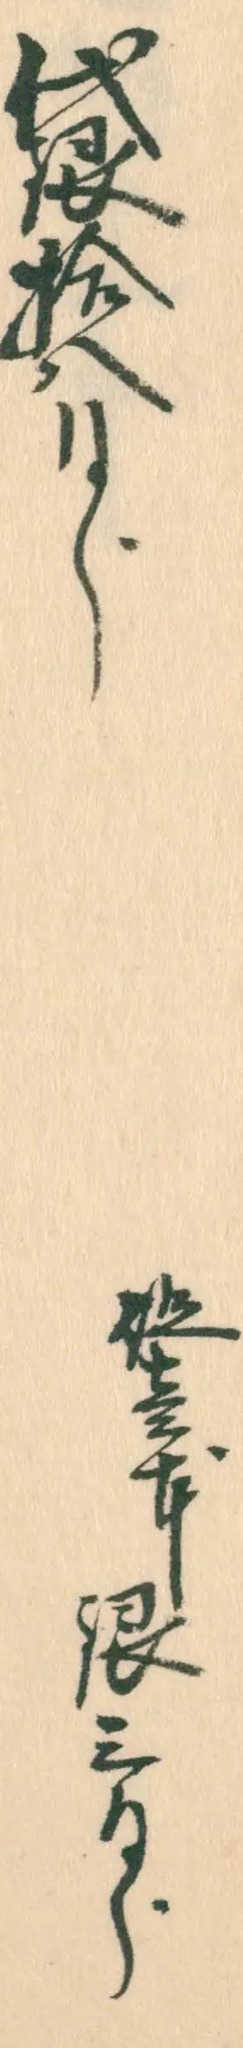代銀拾八匁但壱本銀三匁
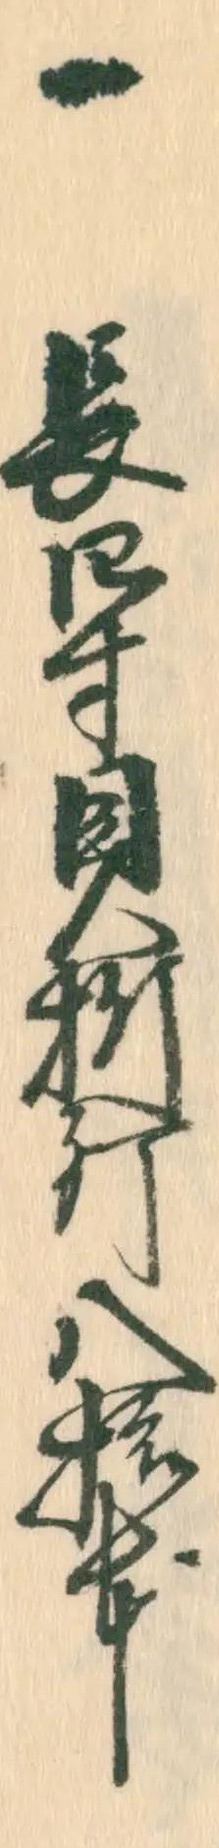一長四寸貝折釘八拾本
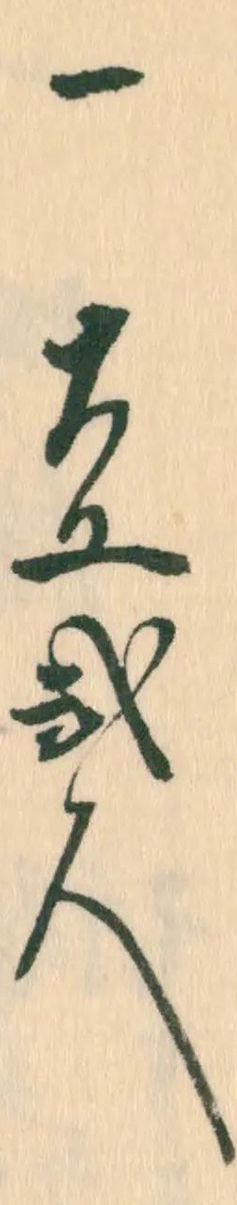一大工弐人
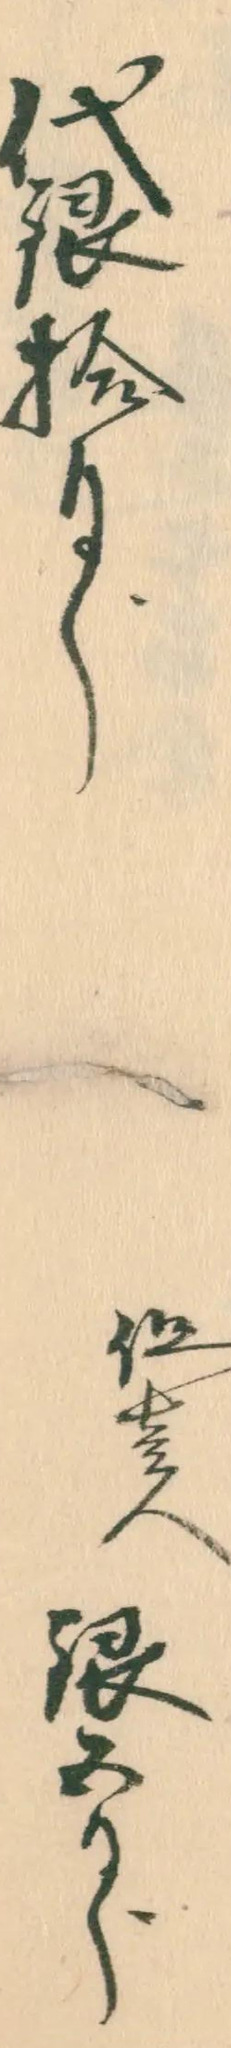代銀拾匁但壱人銀五匁
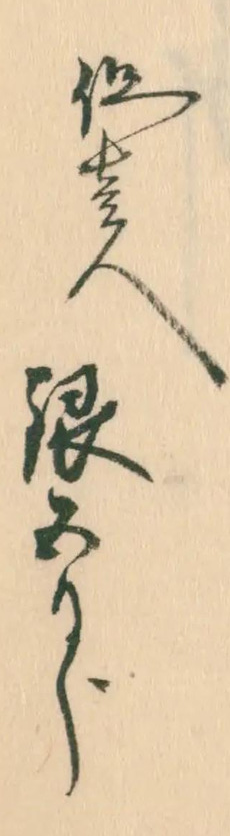代銀拾匁但壱人銀五匁
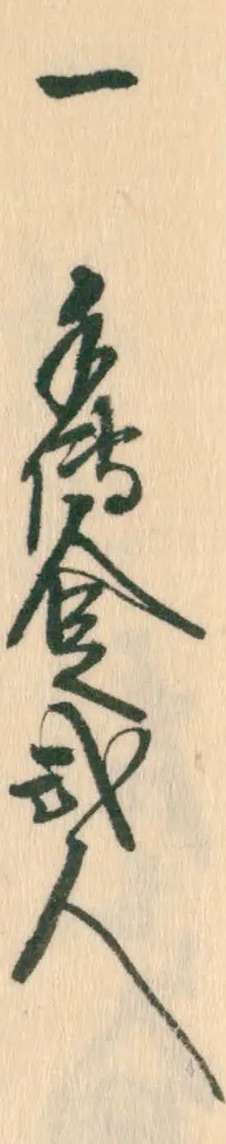一手伝人足弐人
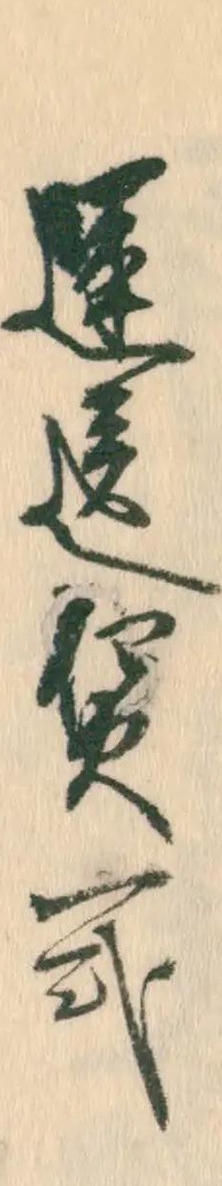一運送賃一式
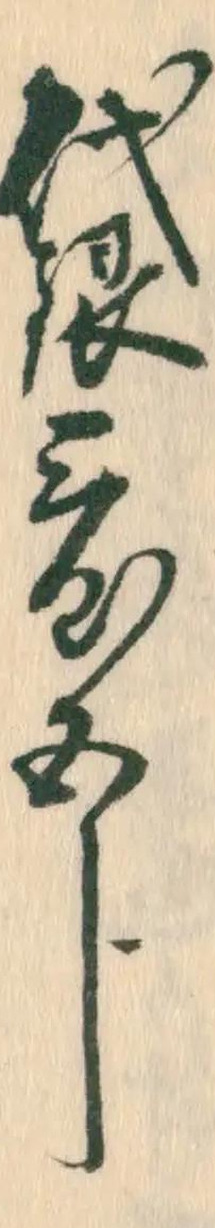代銀三匁五分
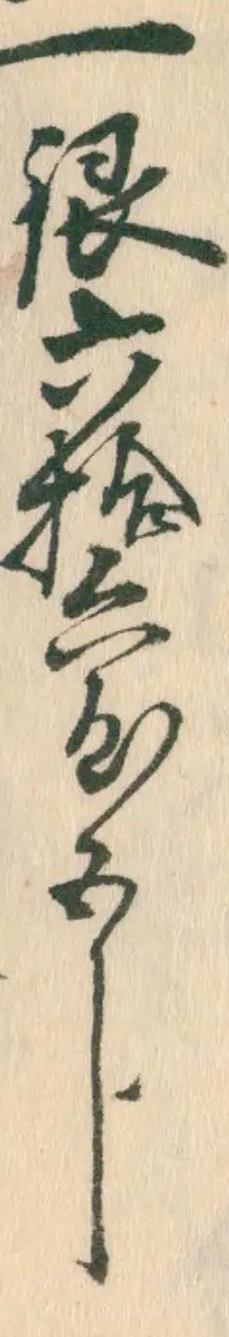〆銀六拾六匁五分
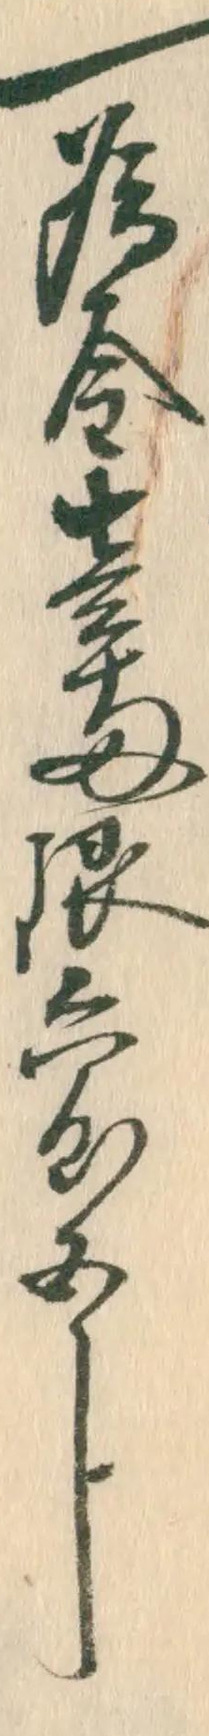為金壱両銀六匁五分

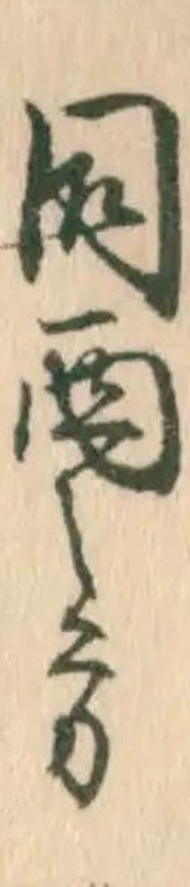同西之方
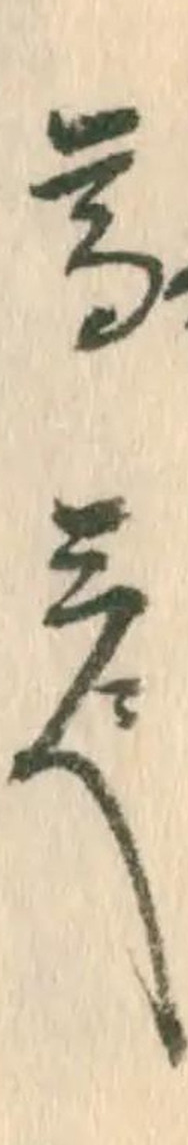高三尺
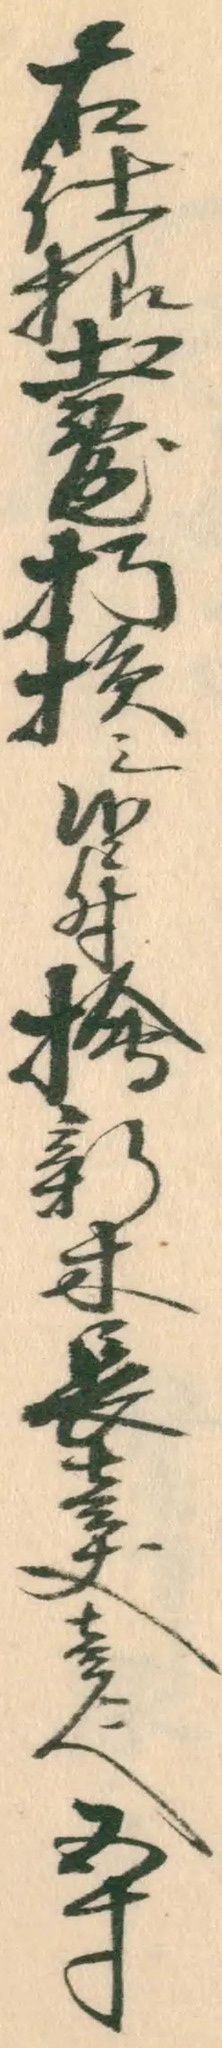右仕様土台朽損シ候ニ付桧新木長壱丈壱尺五寸
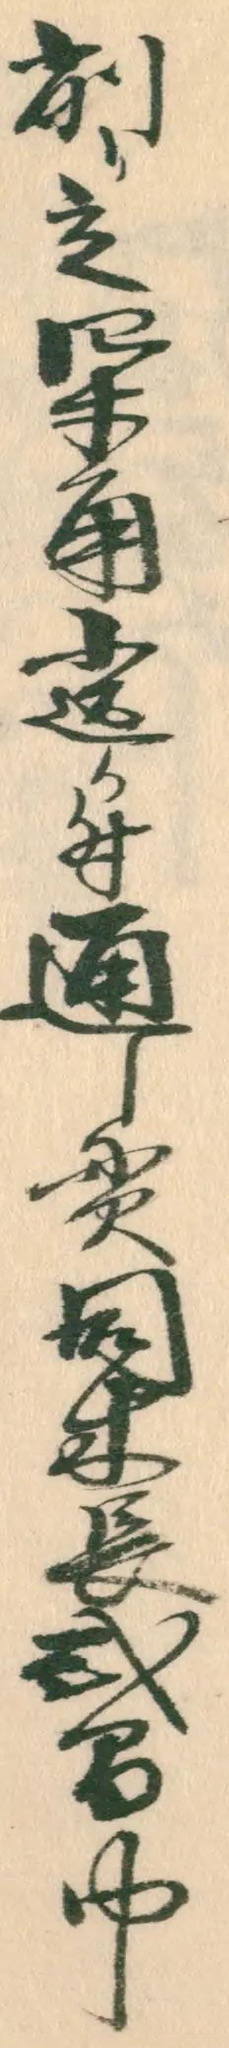削り立四本角小返り付通し貫同木長弐間巾
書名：三橋 17巻. [8] 三橋小破御修復書留　但御奉行御掛リ替地震潰橋番屋　嘉永四亥年より安政二卯年迄　下
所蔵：国立国会図書館 National Diet Library, JAPAN
